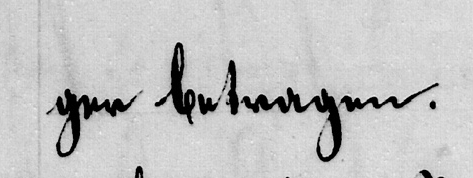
ger betragen.
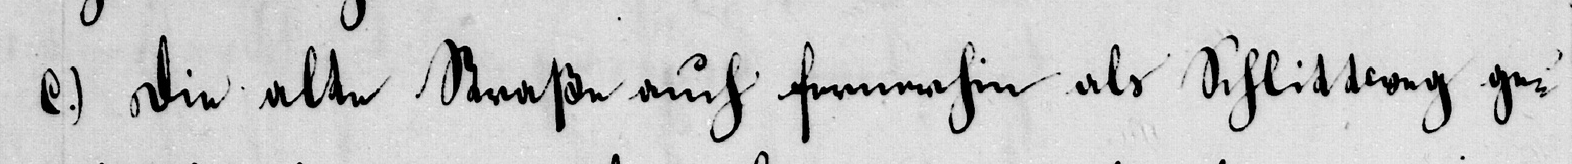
c.) die alte Straße auch fernerhin als Schlittweg ge¬
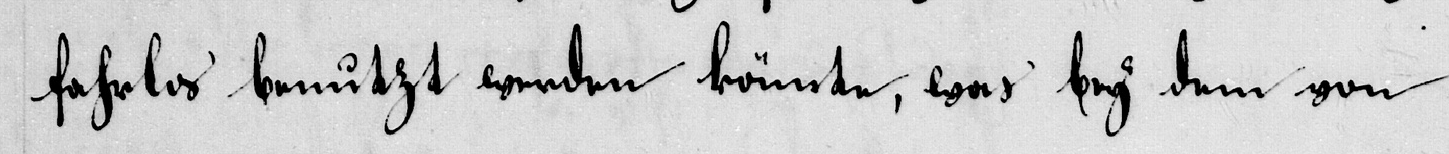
fahrlos benutzt werden könnte, was bey dem von
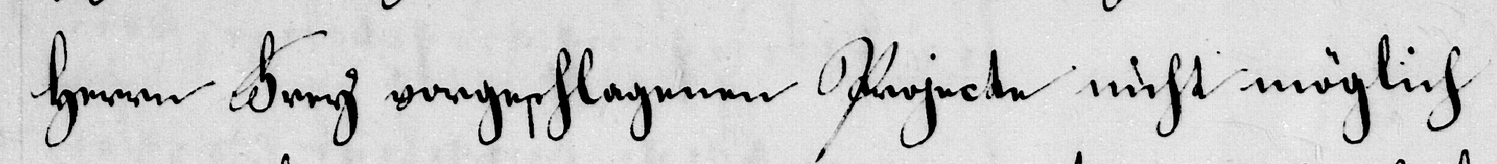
Herrn Frey vorgeschlagenen Projecte nicht möglich
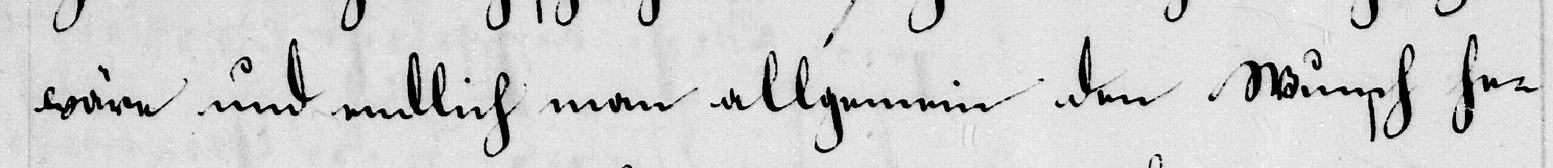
wäre und endlich man allgemein den Wunsch he¬
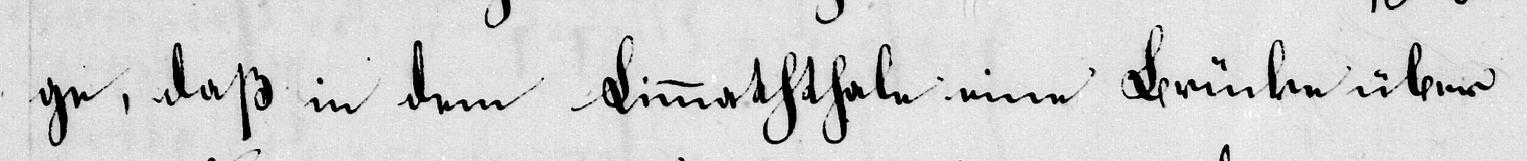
ge, daß in dem Limmaththale eine Brücke über
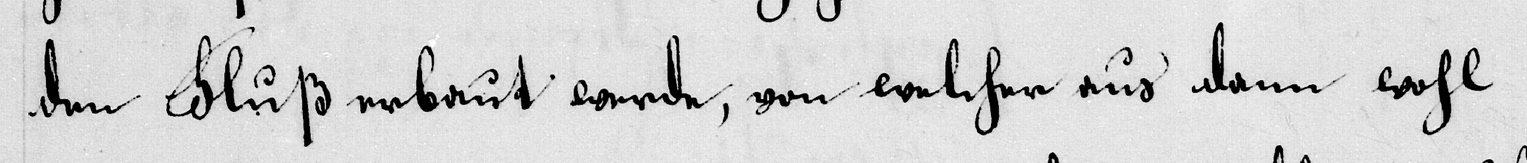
den Fluß erbaut werde, von welcher aus dann wohl
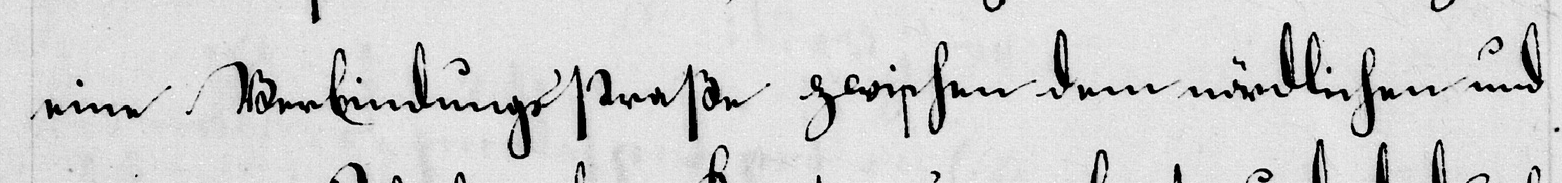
eine Verbindungsstraße zwischen dem nördlichen und
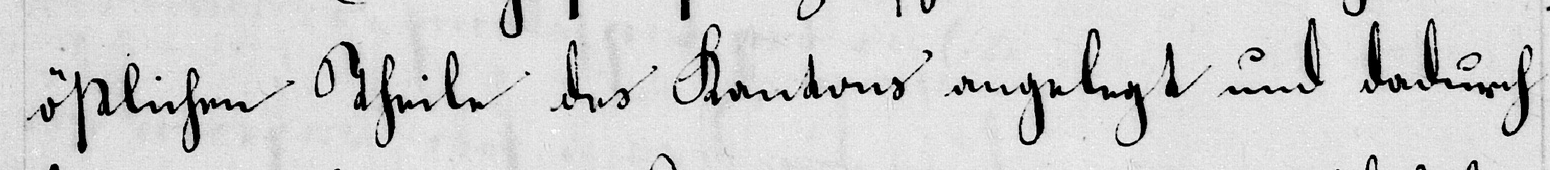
östlichen Theile des Kantons angelegt und dadurch
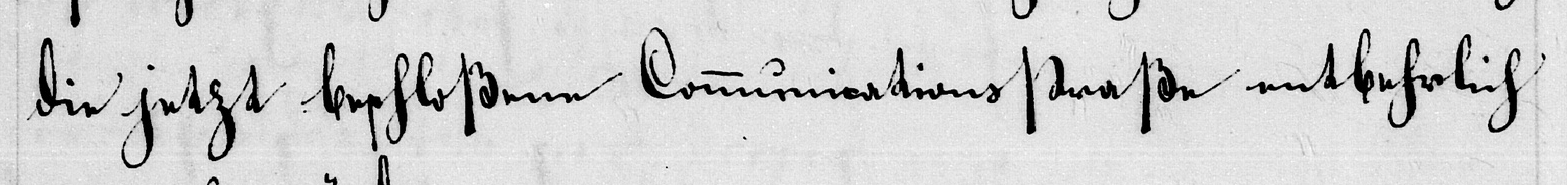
die jetzt beschloßene Communicationsstraße entbehrlich
